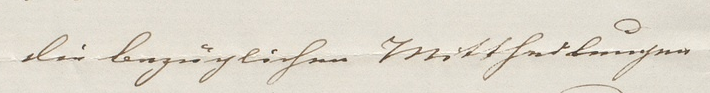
die bezüglichen Mittheilungen
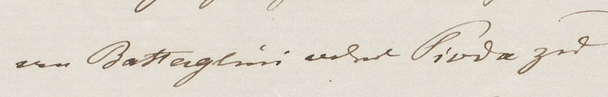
von Battaglini oder Pioda zu
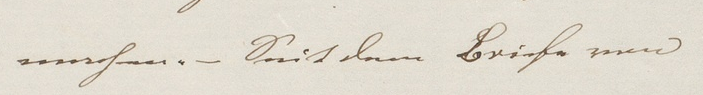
machen . – Seit dem Briefe von
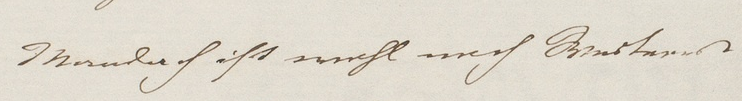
Mandach ist wohl noch Weiteres
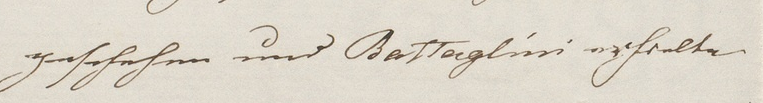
geschehen und Battaglini erhielte
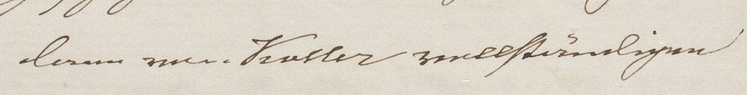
dann von Koller vollständigen
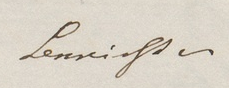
Bericht.
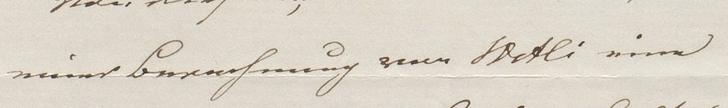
einer Berechnung von Wetli eine
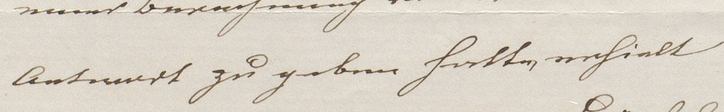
Antwort zu geben hatte, erhielt
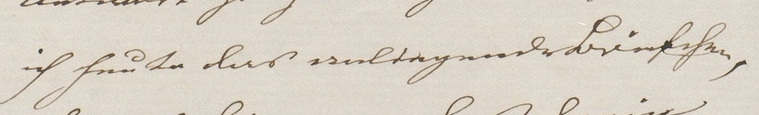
ich heute das anliegende Briefchen,
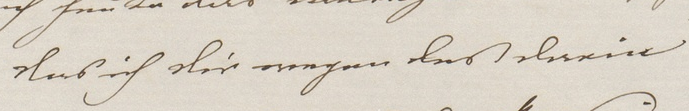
das ich Dir wegen des darin
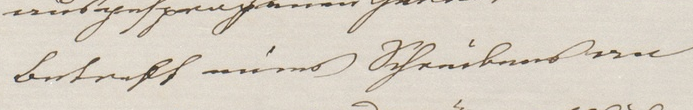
Betreff eines Schreibens an
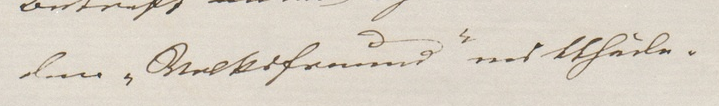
den «Volksfreund» mittheile.
